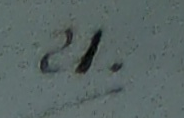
21.
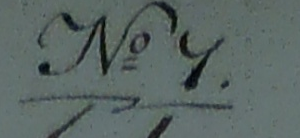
No͇ 7.
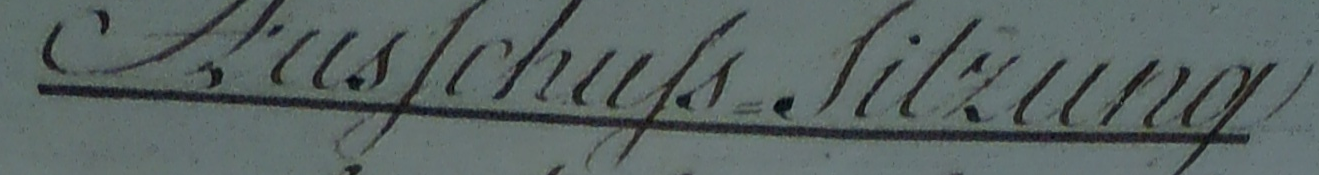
Ausschuss‗Sitzung
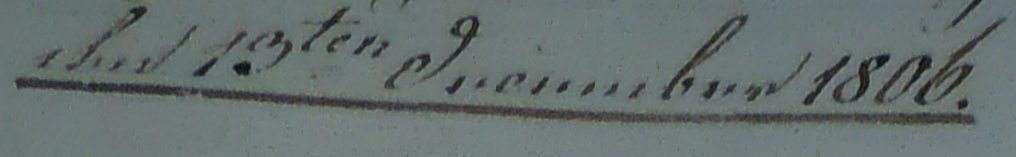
den 13te͇n Dezember 1806.
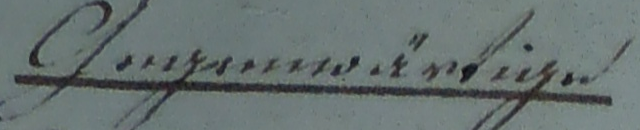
Gegenwärtige
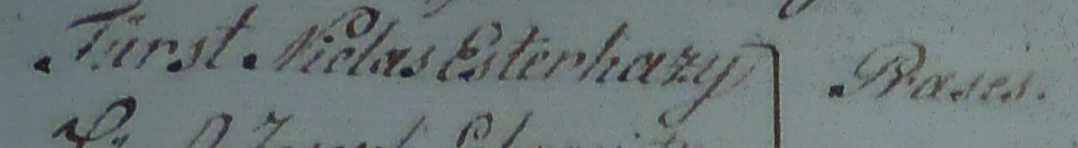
Fürst Niclas Esterhazy Præses.
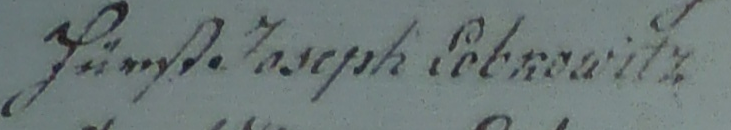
Fürst Joseph Lobkowitz
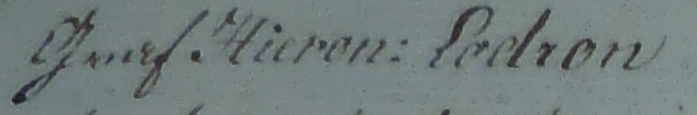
Graf Hieron: Lodron
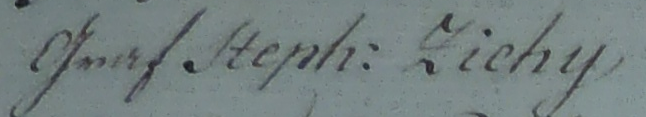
Graf Steph: Zichy
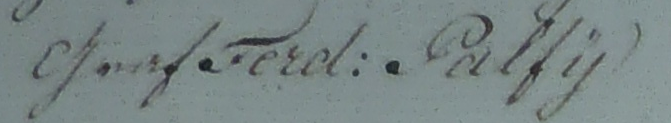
Graf Ferd: Palfy
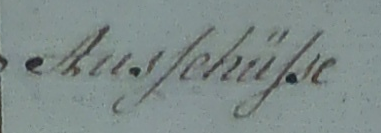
Ausschüsse
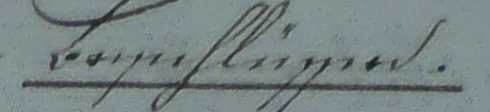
Beschlüsse.
